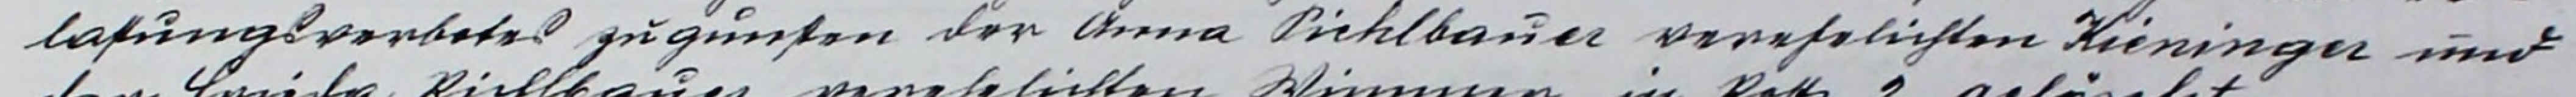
der Frieda Pichlbauer verehelichten Wimmer in Postz. 2 gelöscht.
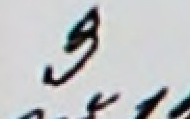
3
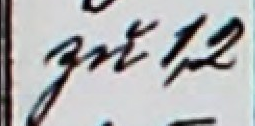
zu 1, 2
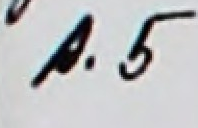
s. 5
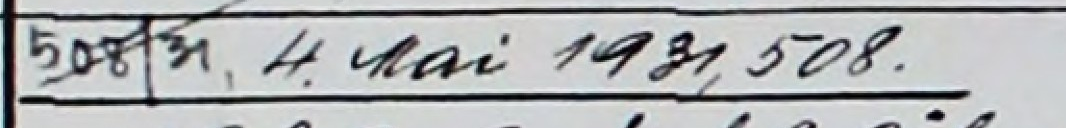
508/31, 4. Mai 1931, 508.
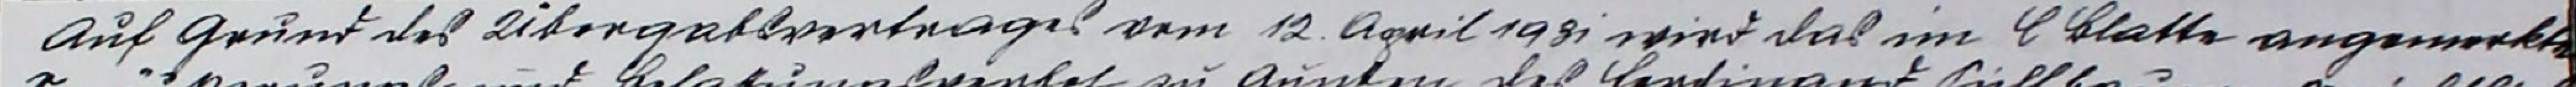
Auf Grund des Übergabsvertrages vom 12. April 1931 wird das im C Blatte angemerkte
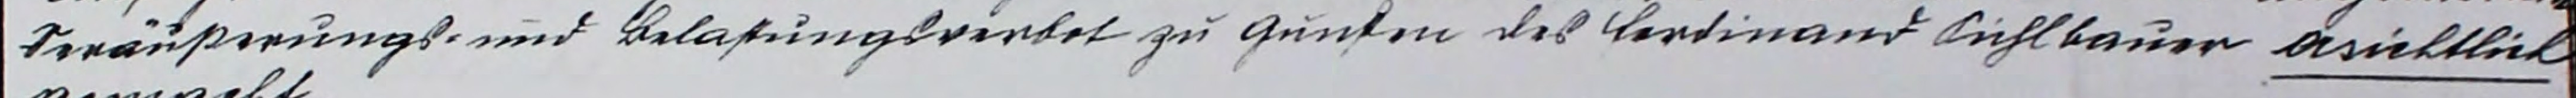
Veräußerungs- und Belastungsverbot zu Gunsten des Ferdinand Pichlbauer Asichtlich
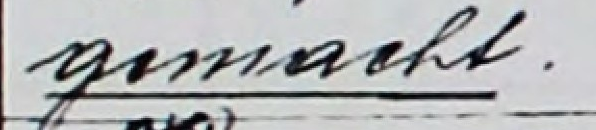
gemacht.
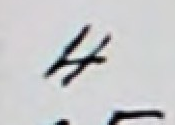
4
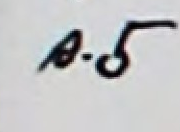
s. 5
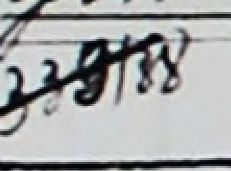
333/38
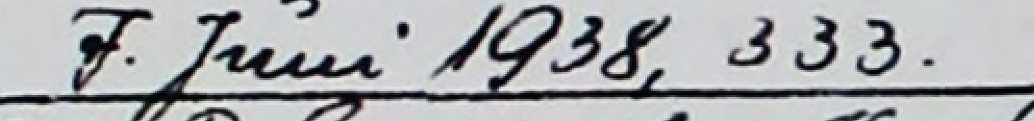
7. Juni 1938, 333.
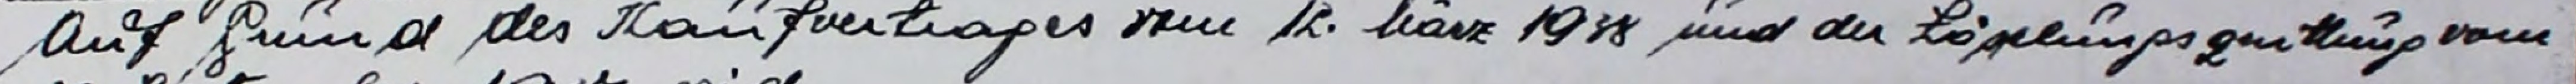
Auf Grund des Kaufvertrages dem K. März 1938 und der Löschungsquittung vom
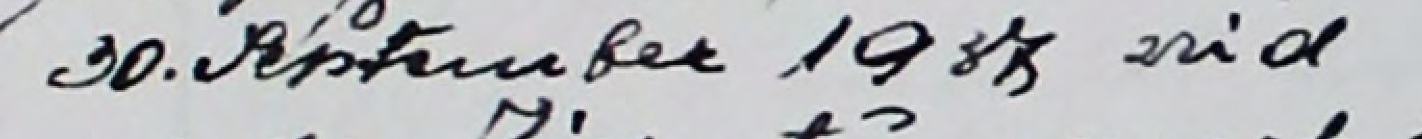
30. September 1937, ?id
